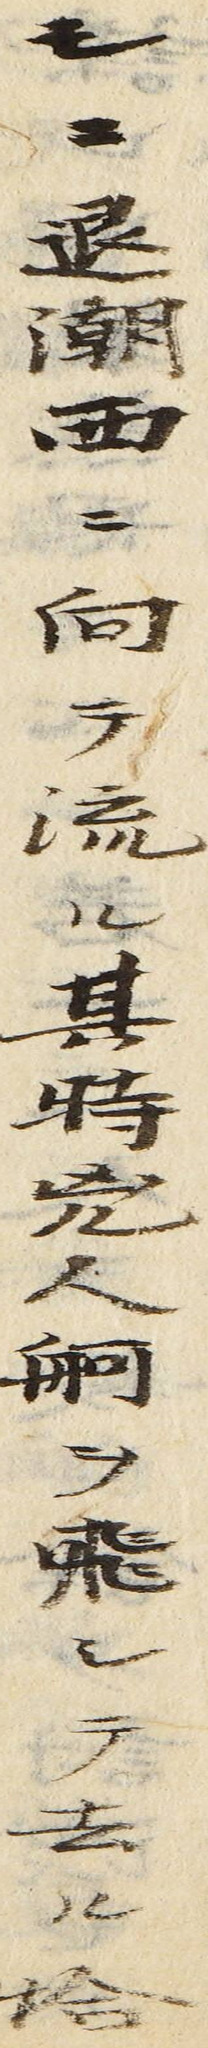シニ退潮西ニ向テ流ル其時兇人舸ヲ飛シテ去ル恰
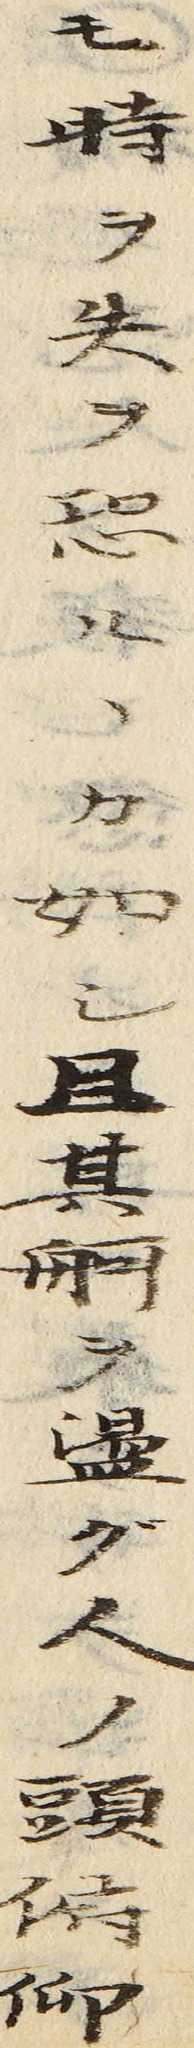モ時ヲ失ヲ恐ルヽカ如シ且其舸ヲ盪グ人ノ頭俯仰
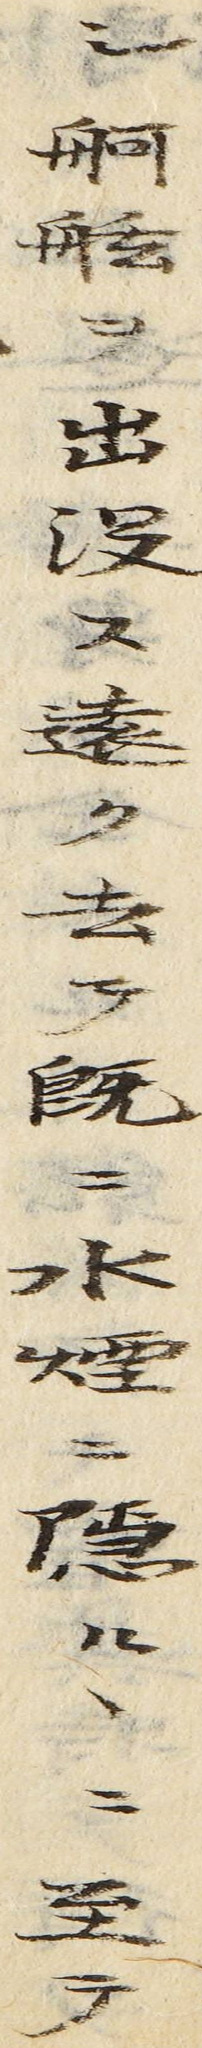シ舸舷ヲ出没ス遠ク去テ既ニ水煙ニ隠ルヽニ至テ
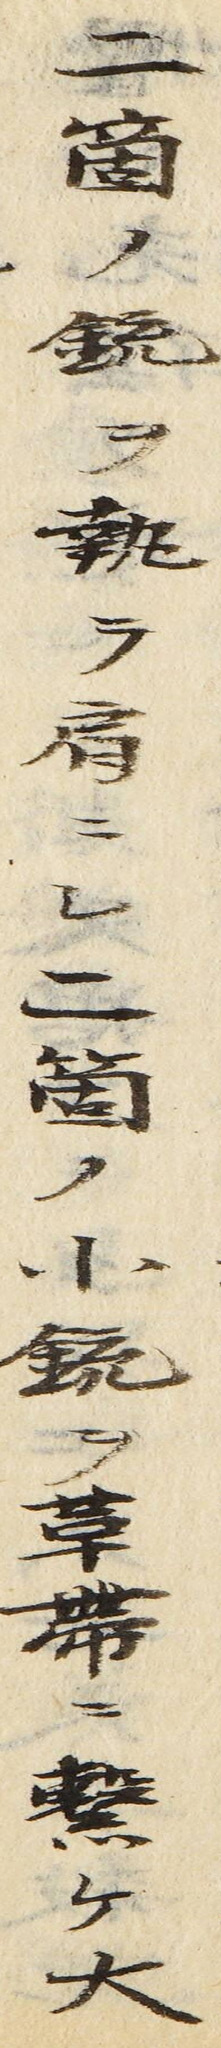二箇ノ銃ヲ執テ肩ニシ二箇ノ小銃ヲ革帯ニ繋ケ大
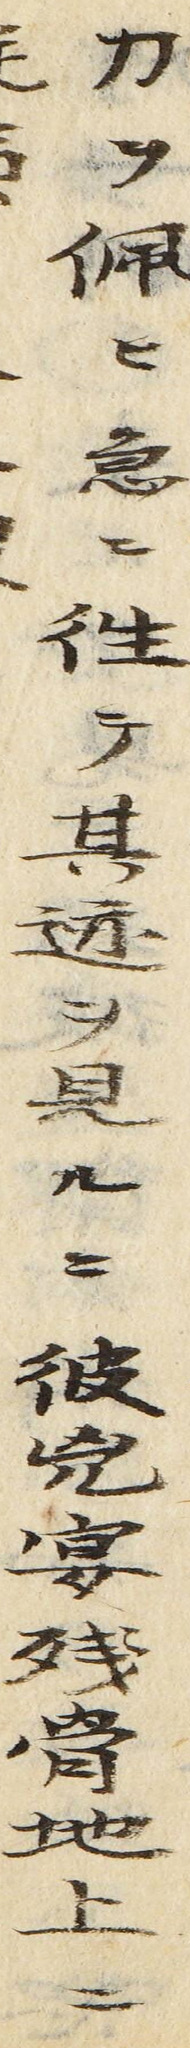刀ヲ佩ヒ急ニ往テ其迹ヲ見ルニ彼兇宴残骨地上ニ
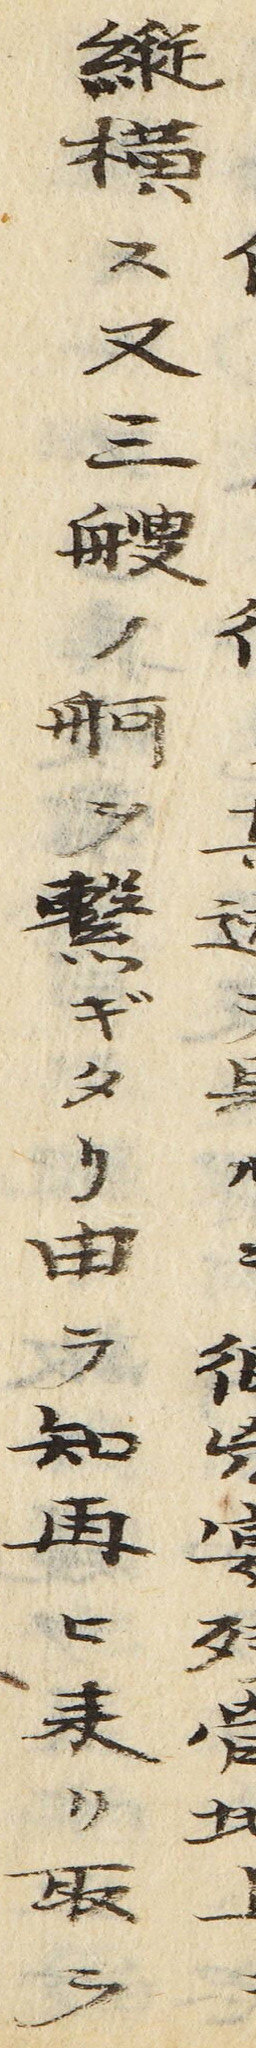縦横ス又三艘ノ舸ヲ繋ギタリ由テ知再ヒ来リ取ラ

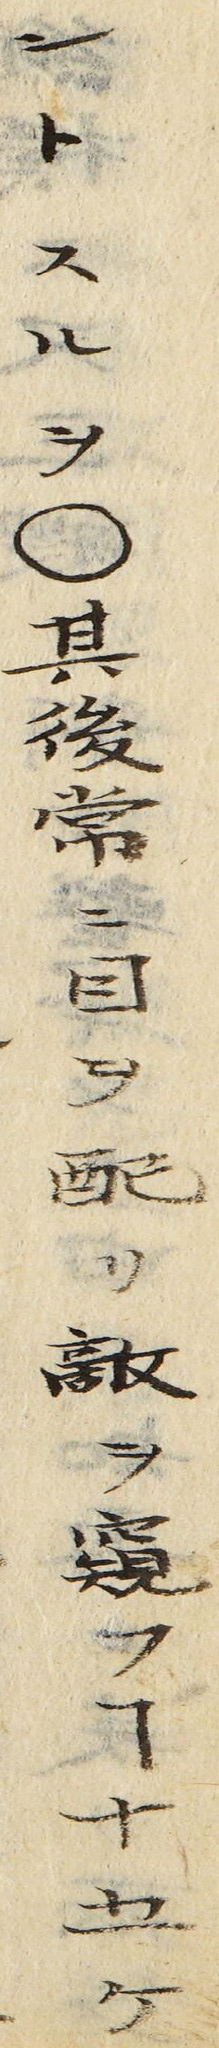ントスルヲ◯其後常ニ目ヲ配リ敵ヲ窺フコト十五ケ
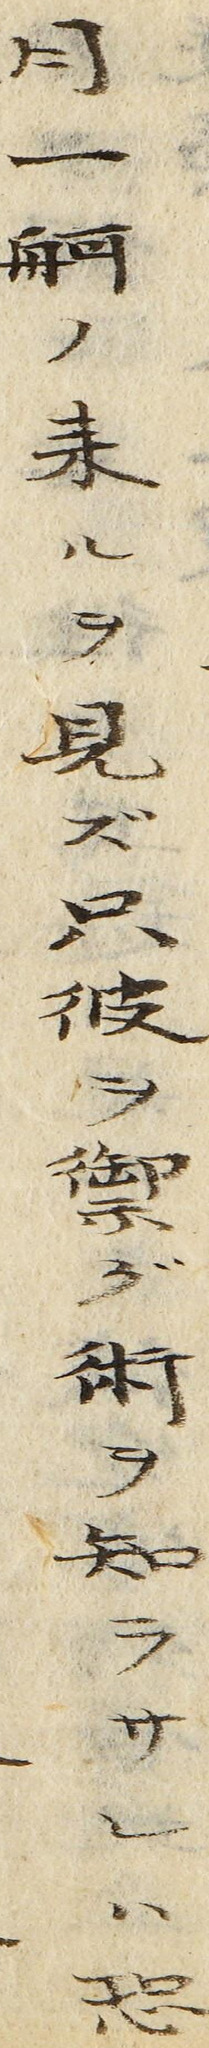月一舸ノ来ルヲ見ズ只彼ヲ禦グ術ヲ知ラサレハ恐
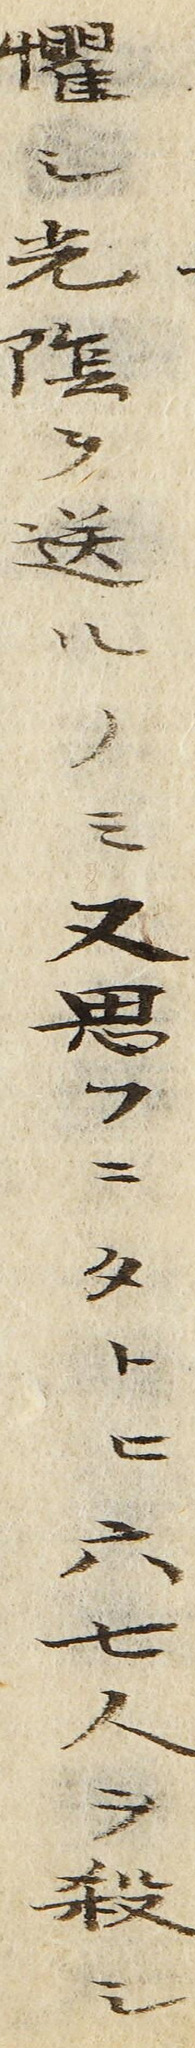懼シ光陰ヲ送ルノミ又思フニタトヒ六七人ヲ殺シ
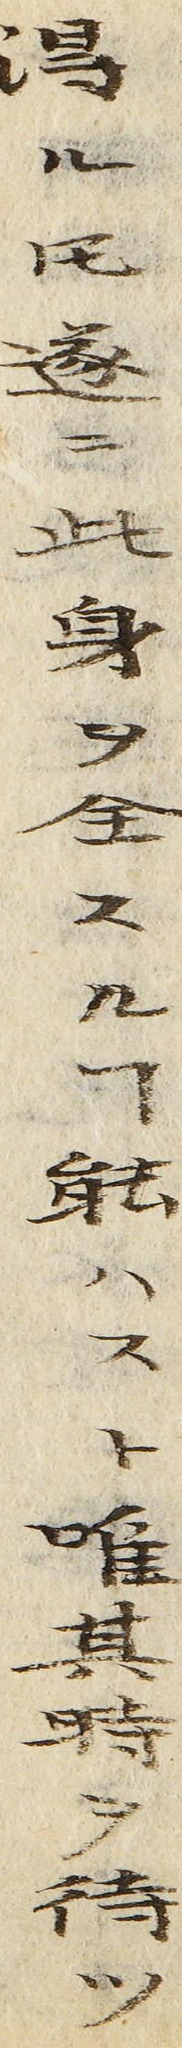得ルトモ遂ニ此身ヲ全スルコト能ハスト唯其時ヲ待ツ
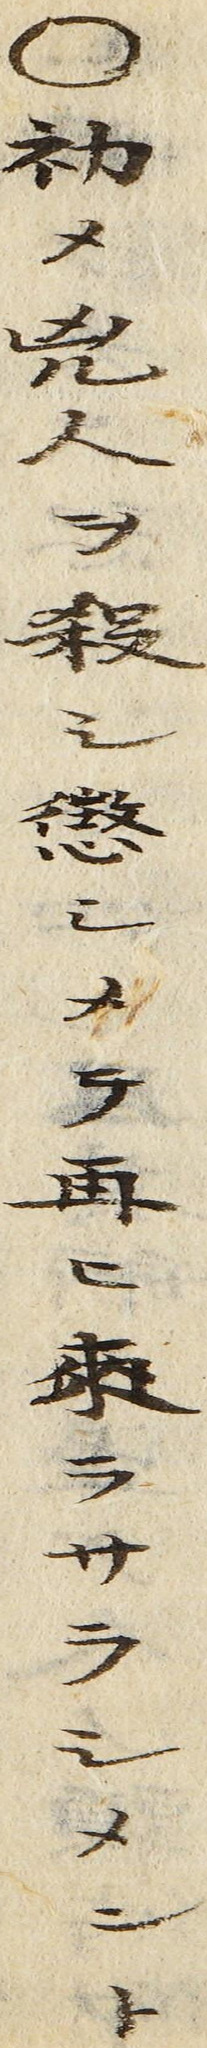◯初メ兇人ヲ殺シ懲シメテ再ヒ来ラサラシメント
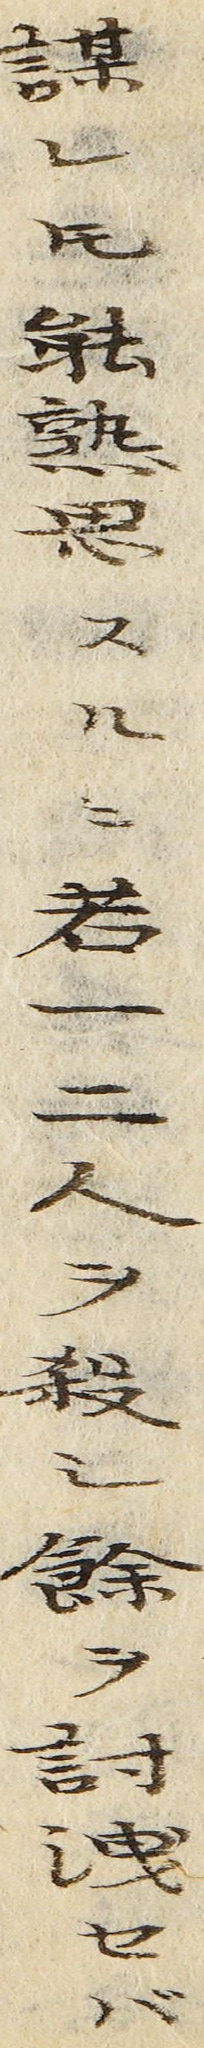謀レトモ能熟思スルニ若一二人ヲ殺シ余ヲ討洩セバ
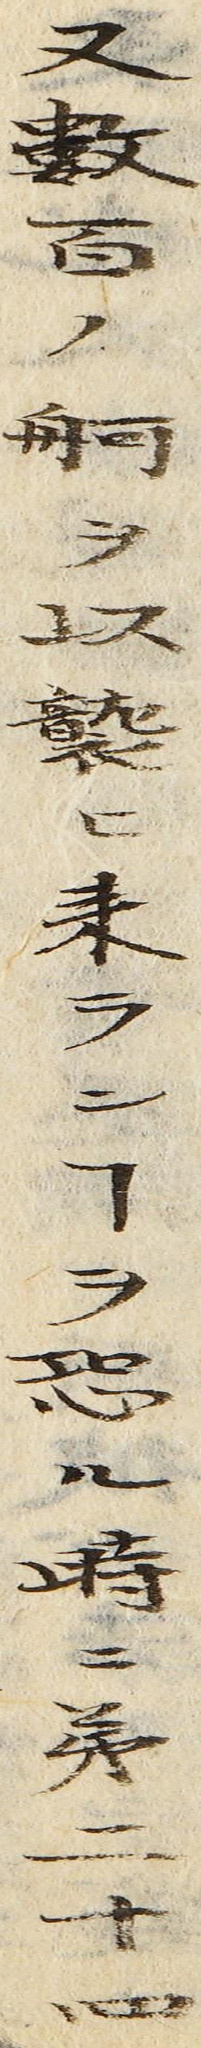又数百ノ舸ヲ以襲ヒ来ランコトヲ恐ル時ニ第二十四
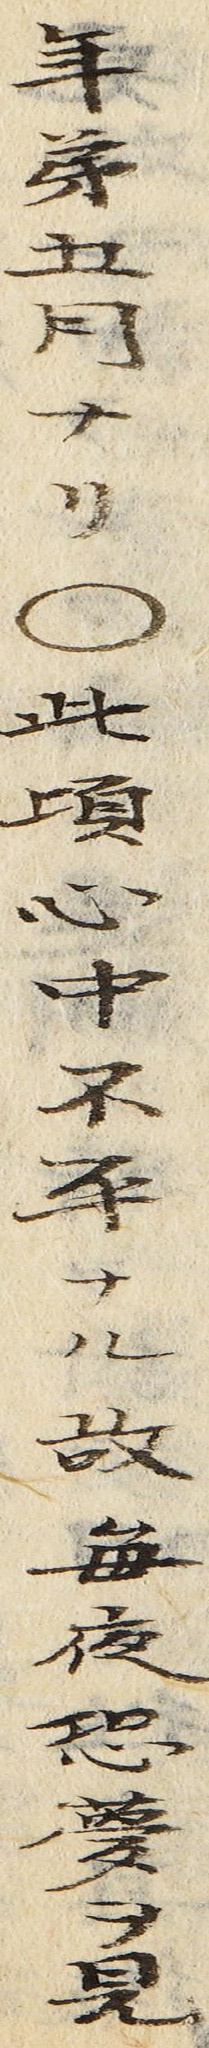年第五月ナリ◯此頃心中不平ナル故毎夜恐夢ヲ見
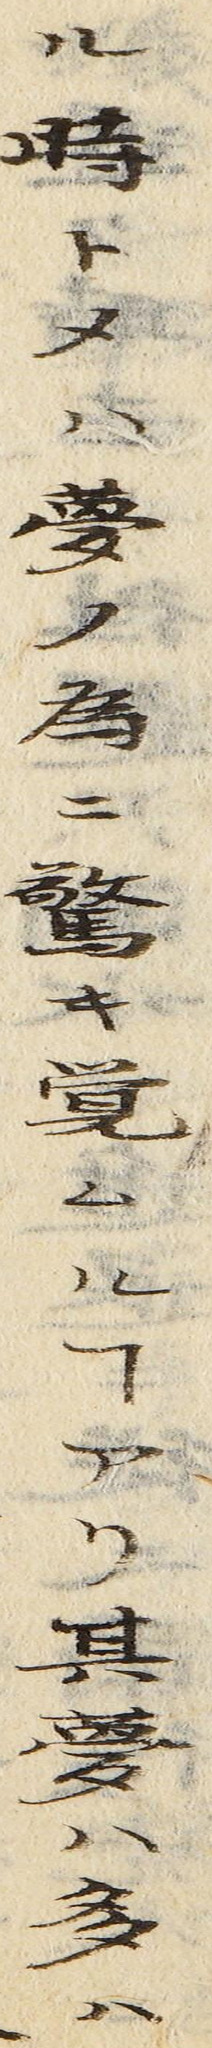ル時トシテハ夢ノ為ニ驚キ覚ムルコトアリ其夢ハ多ハ
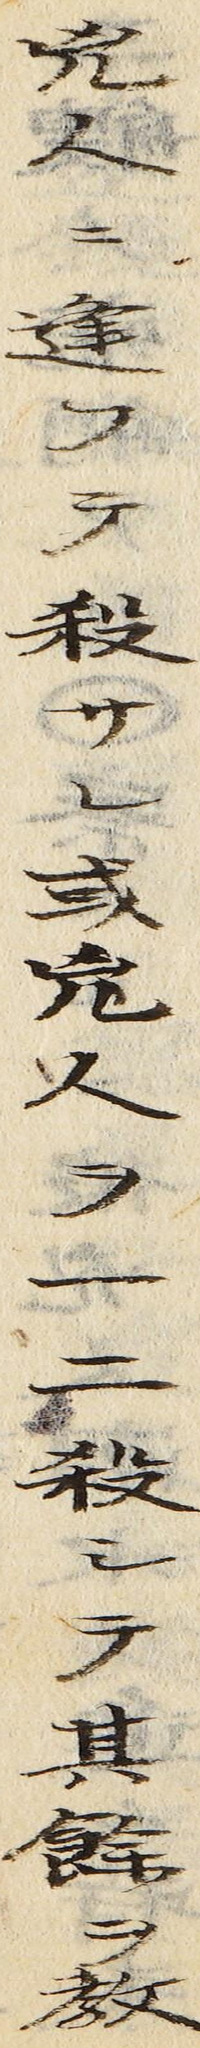兇人ニ逢フテ殺サレ或兇人ヲ一二殺シテ其余ヲ教
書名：漂流紀事
